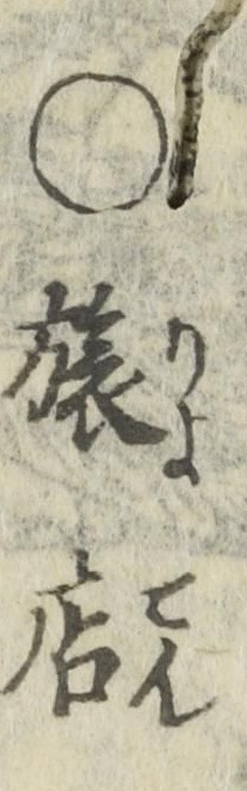○旅店
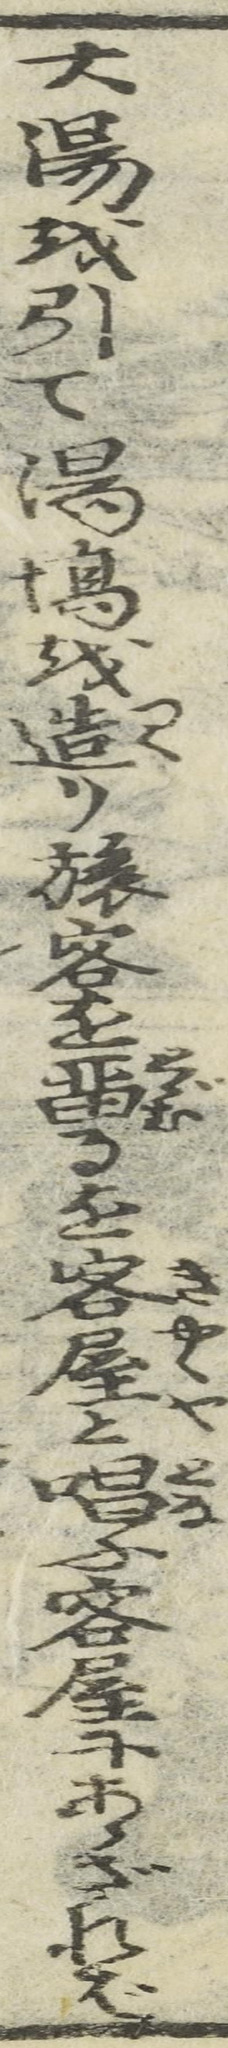大湯を引て湯場を造り旅客を留るを客屋と唱ふ客屋にあらざれば
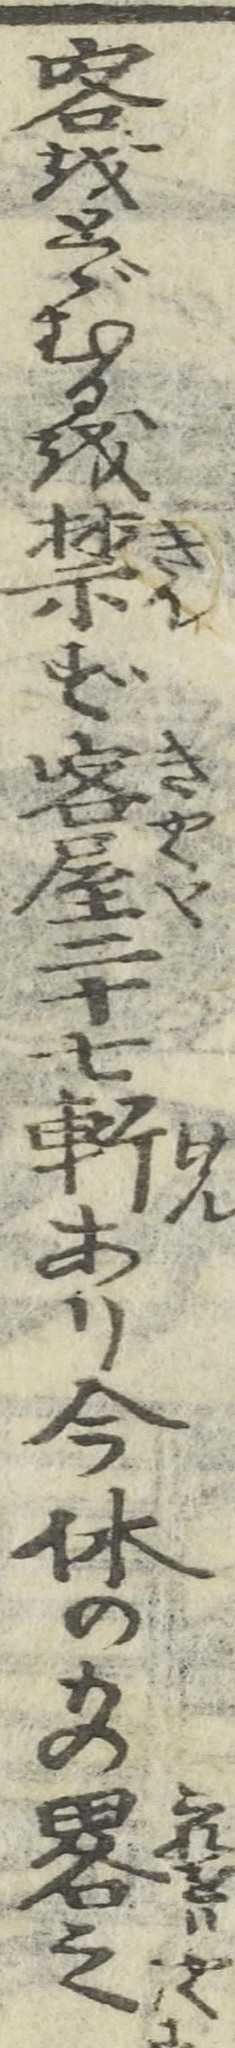客をとゞむるを禁ず客屋二十七軒あり今休のもの略之
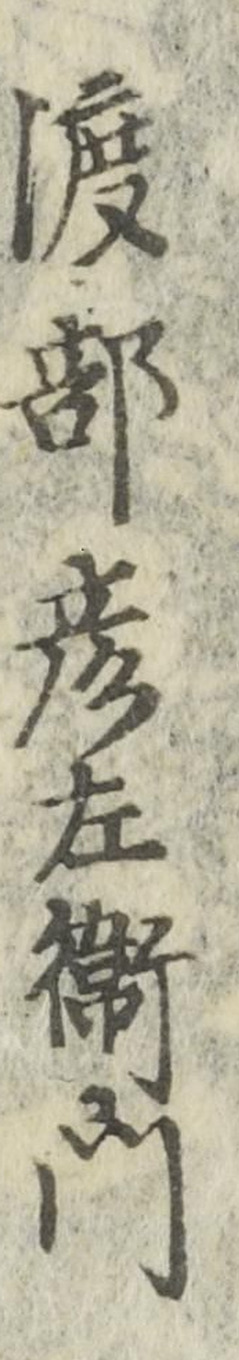渡部彦左衛門
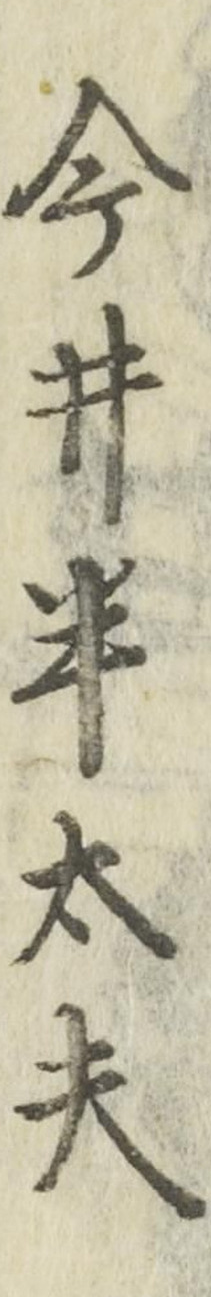今井半太夫
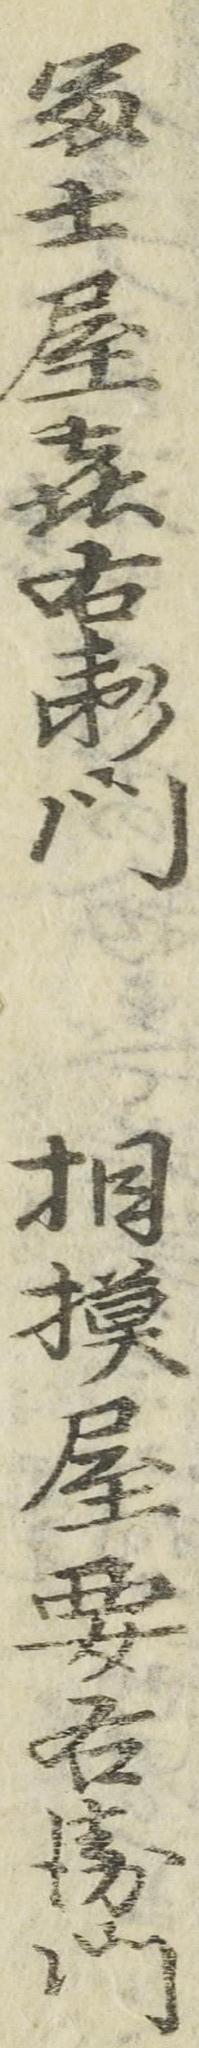富士屋㐂右衛門相模屋要右衛門
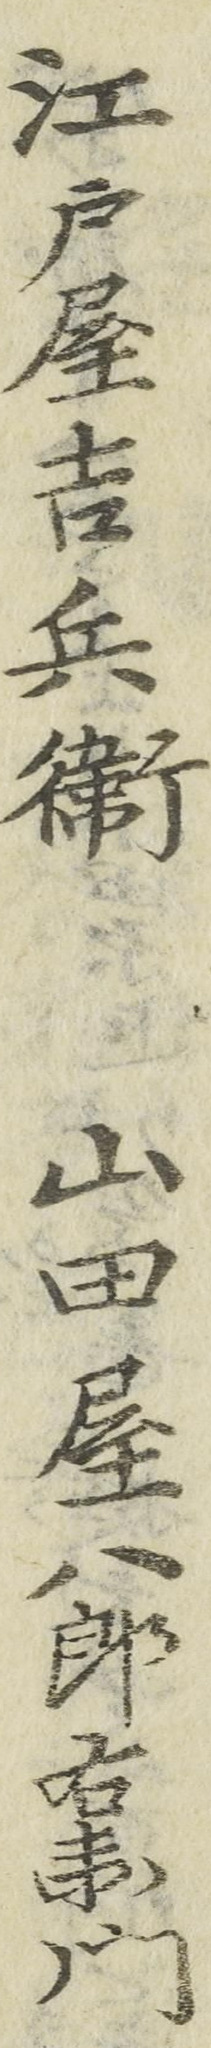江戸屋吉兵衛山田屋八郎右衛門
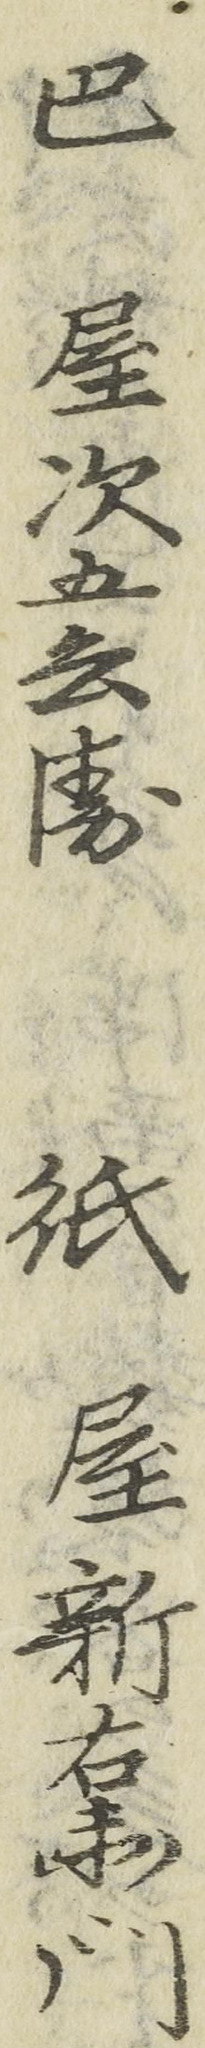巴屋次五兵衛紙屋新右衛門
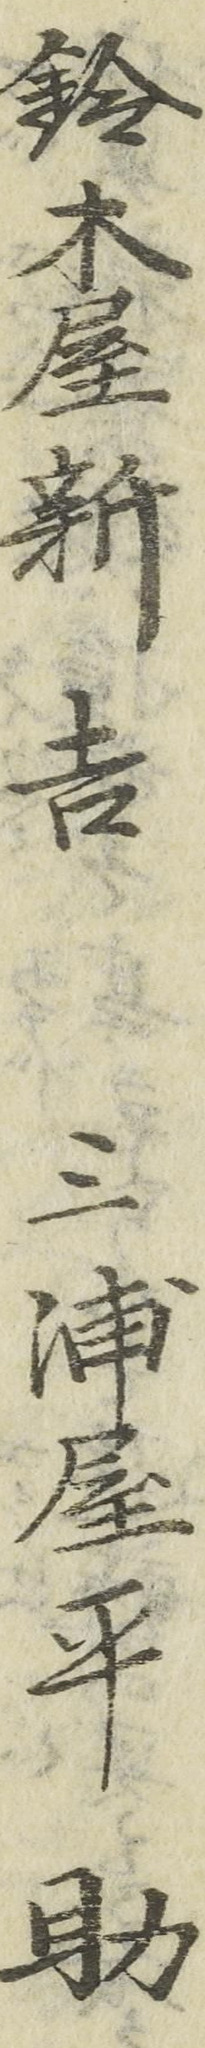鈴木屋新吉三浦屋平助
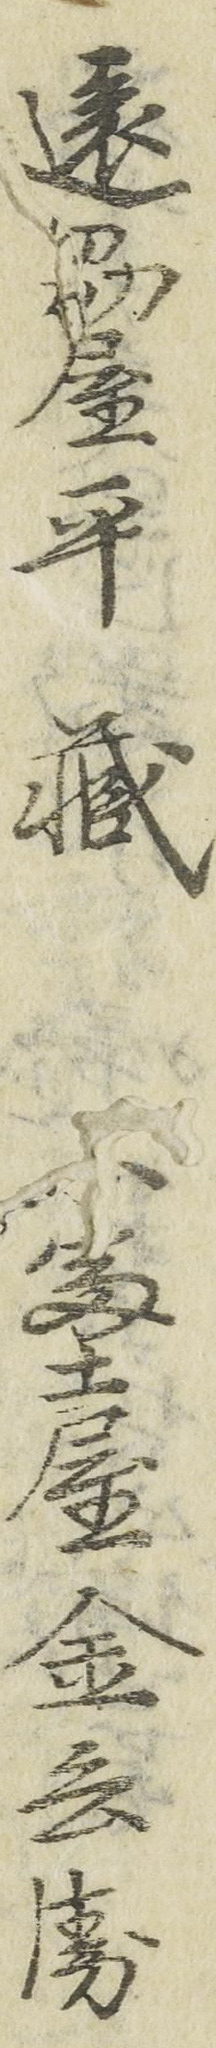遠刕屋平蔵小富士屋金兵衛
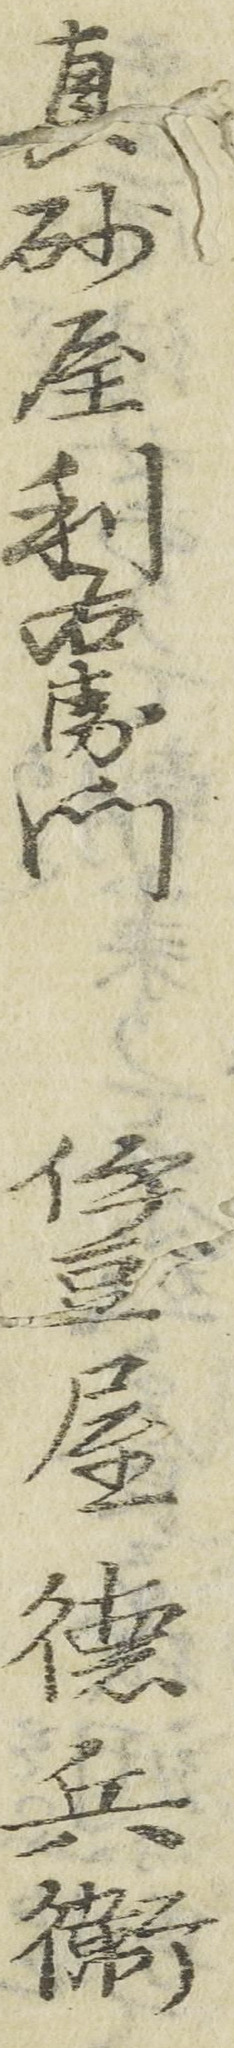真砂屋利右衛門伊豆屋徳兵衛
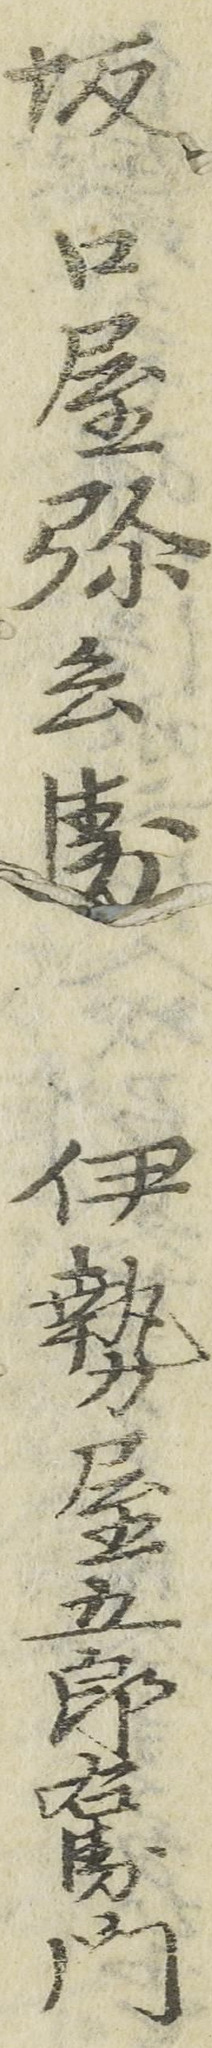坂口屋弥兵衛伊勢屋五郎右衛門
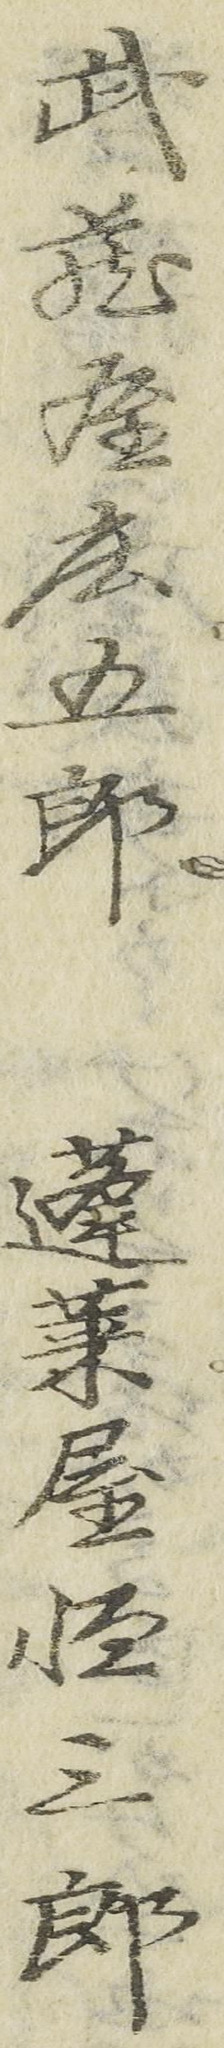武藤屋庄五郎蓬莱屋恒三郎
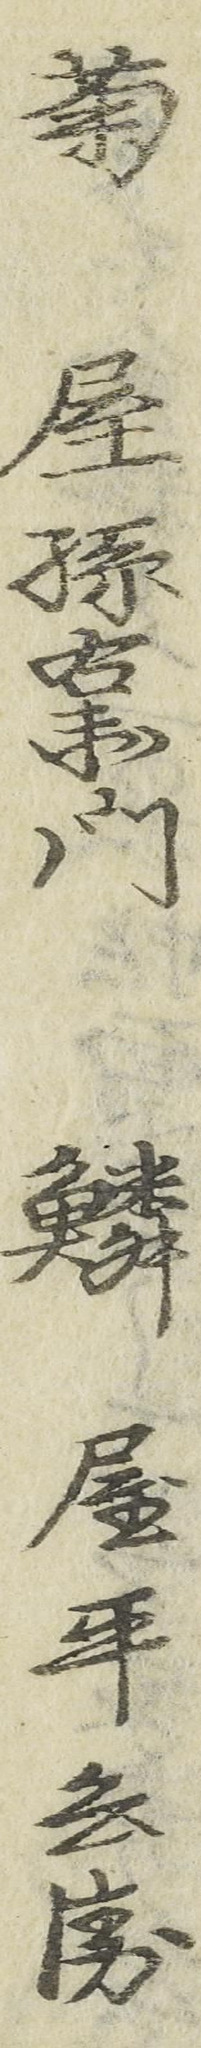菊屋孫右衛門鱗屋平兵衛
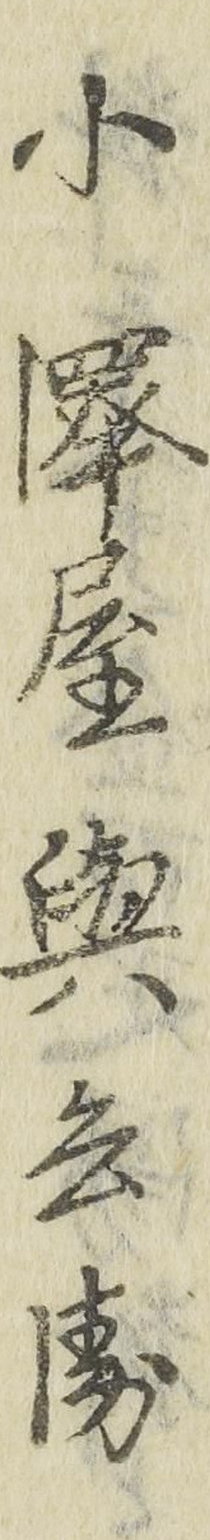小澤屋與兵衛
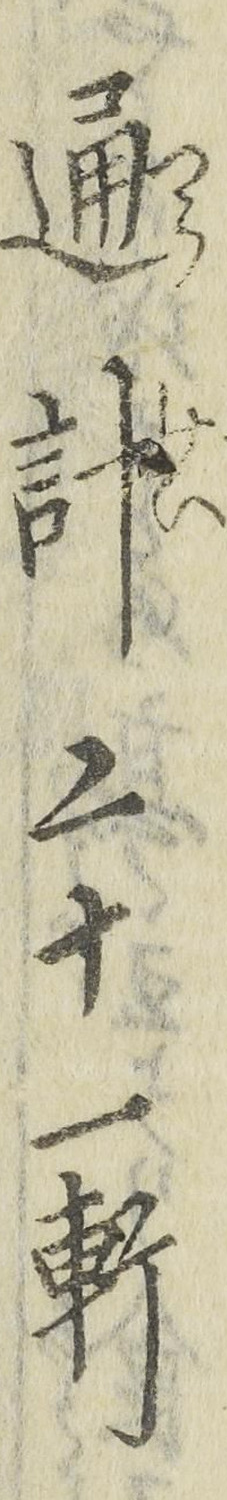通計二十一軒
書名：熱海温泉圖彙
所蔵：東京大学地震研究所図書室 Earthquake Research Institute Library, The University of Tokyo, JAPAN
